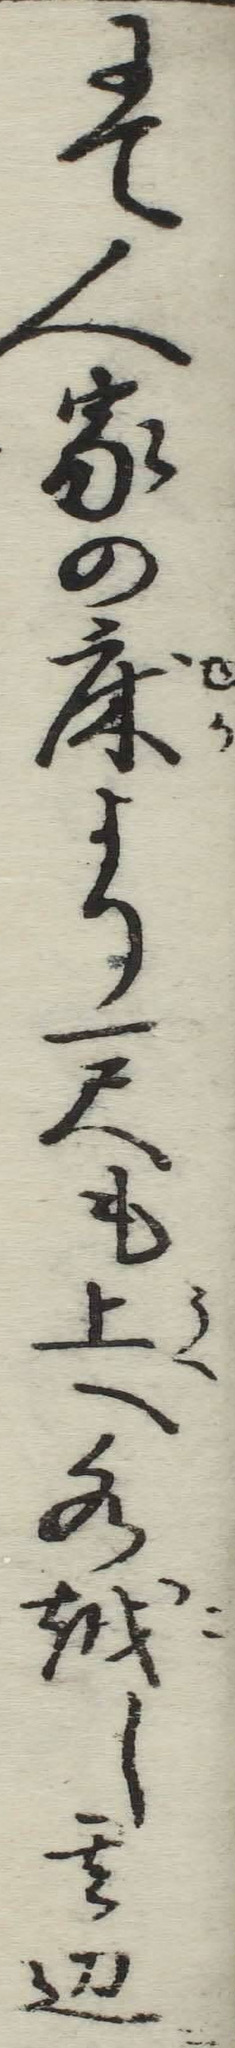にて人家の床より一尺も上へ越こし其辺
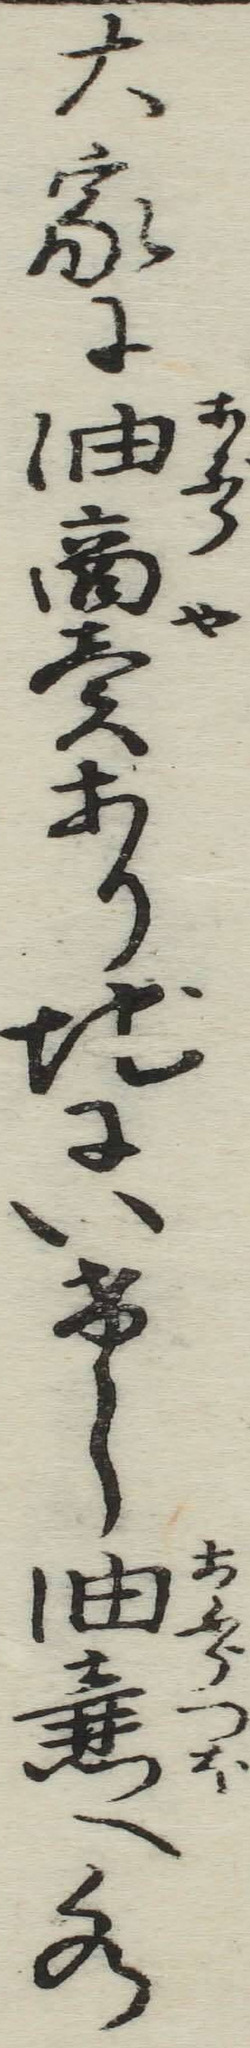大家に油商売やあり地にいけし油壷へ水
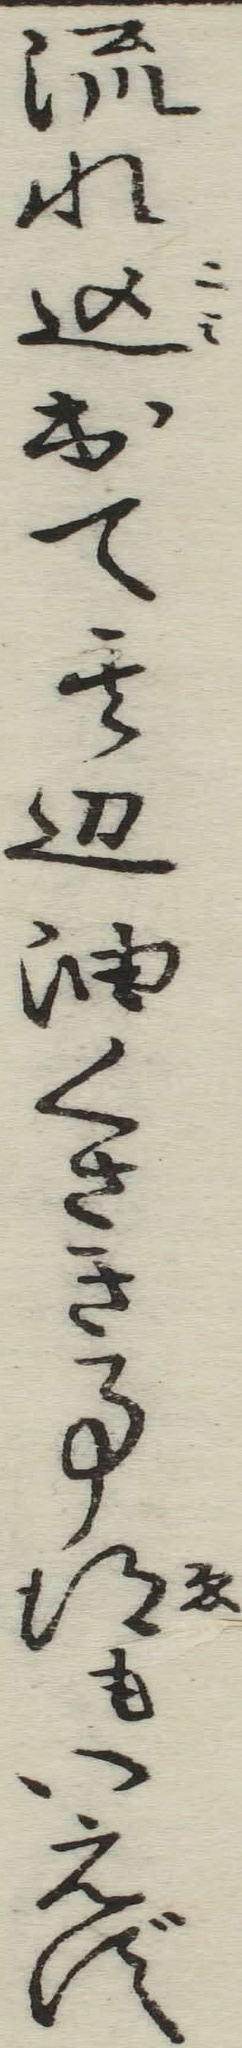流れ込出て其辺油くさき事得もいえず
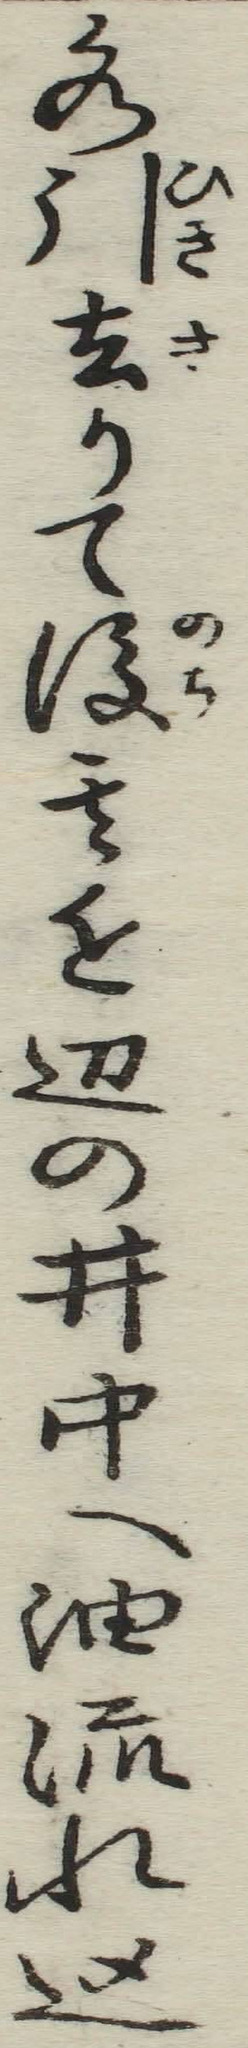水引去りて後其近辺の井中へ油流れ込
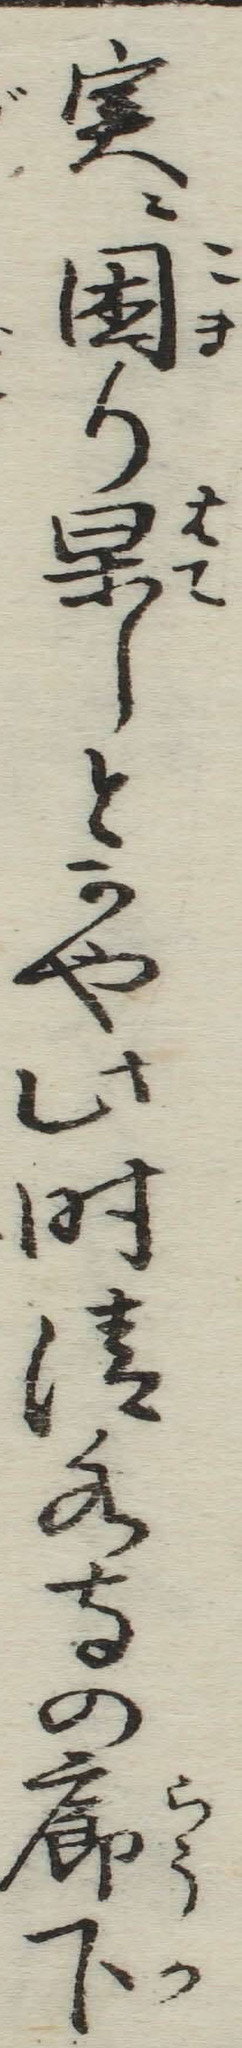実二困り果しとかや此時清水寺の廊下
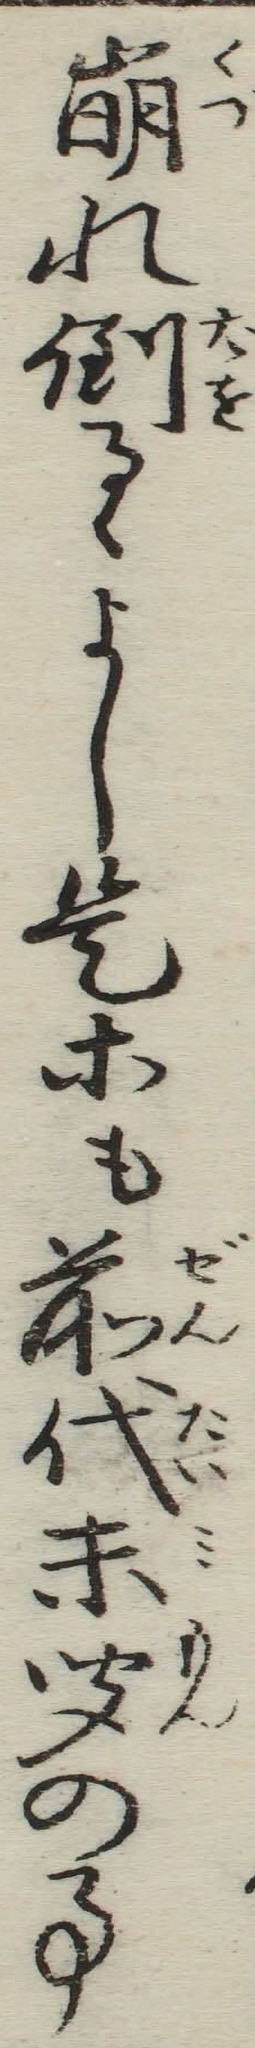崩れ倒るゝよし是等も前代未聞の事
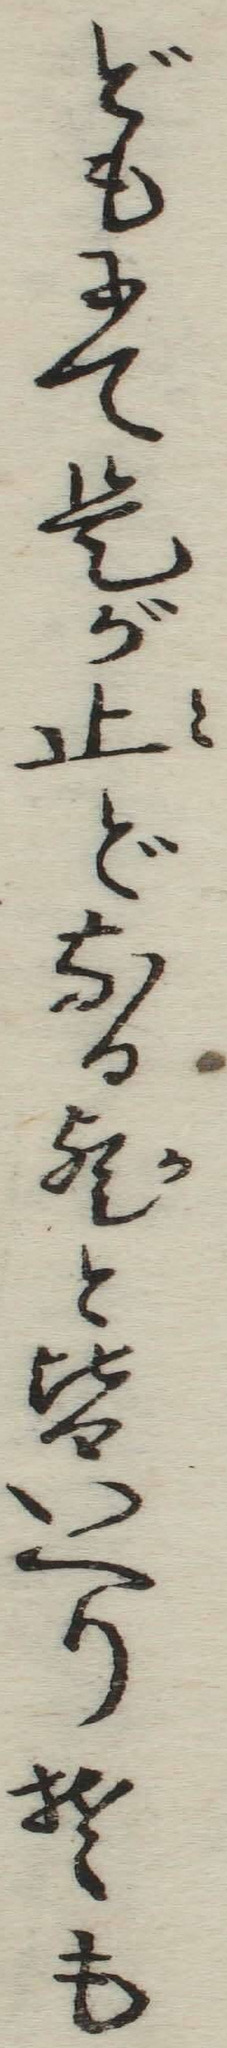どもにて是が止どなる歟と皆いへりそも
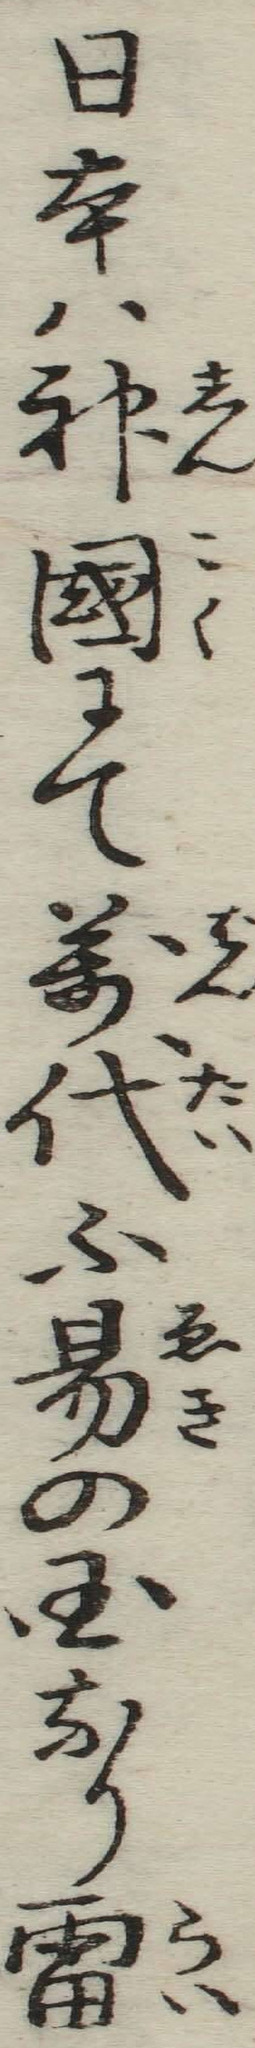日本は神国にて万代不易の国なり雷

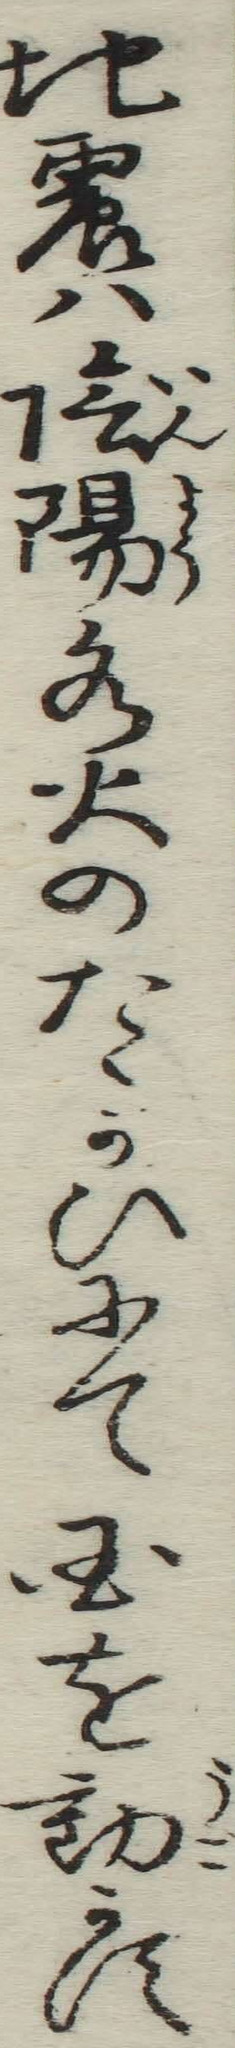地震は陰陽水火のたゝかひにて国を動かす
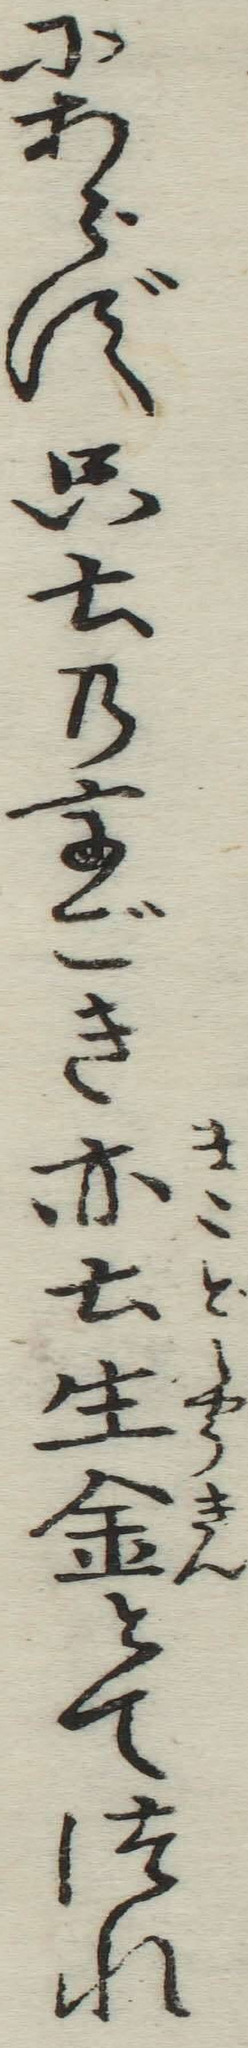にあらず只土のうごき亦土生金とてつれ
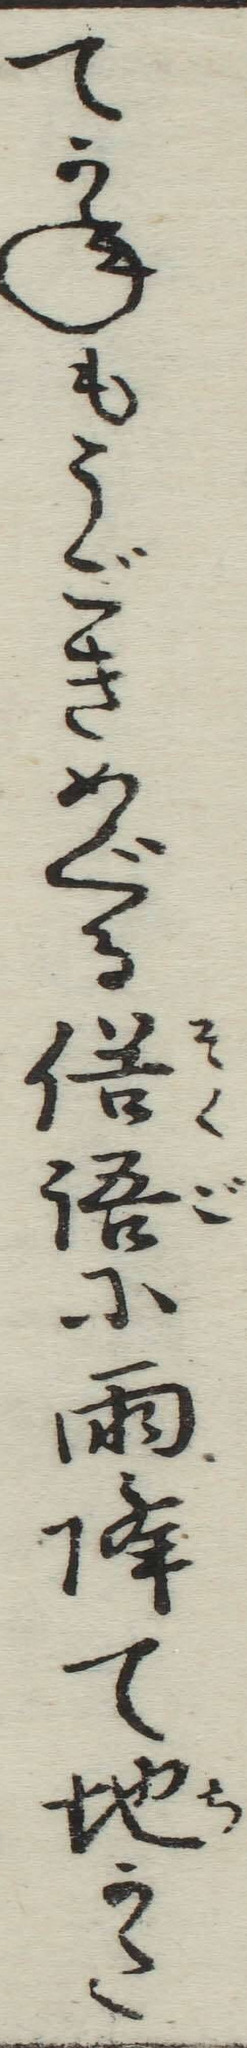てかねもうごきめぐる俗語に雨降て地かた
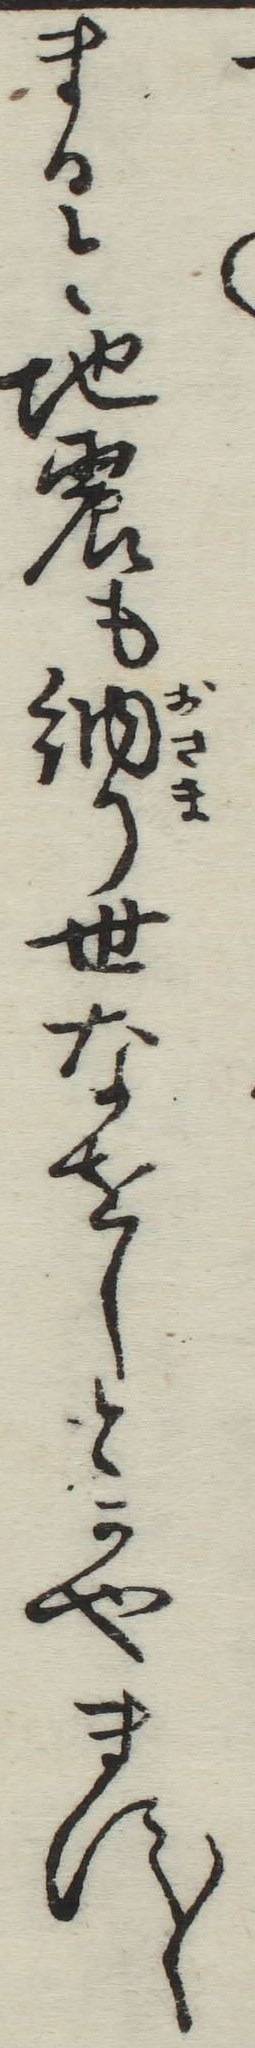まると地震も納り世なをしとかやます〳〵
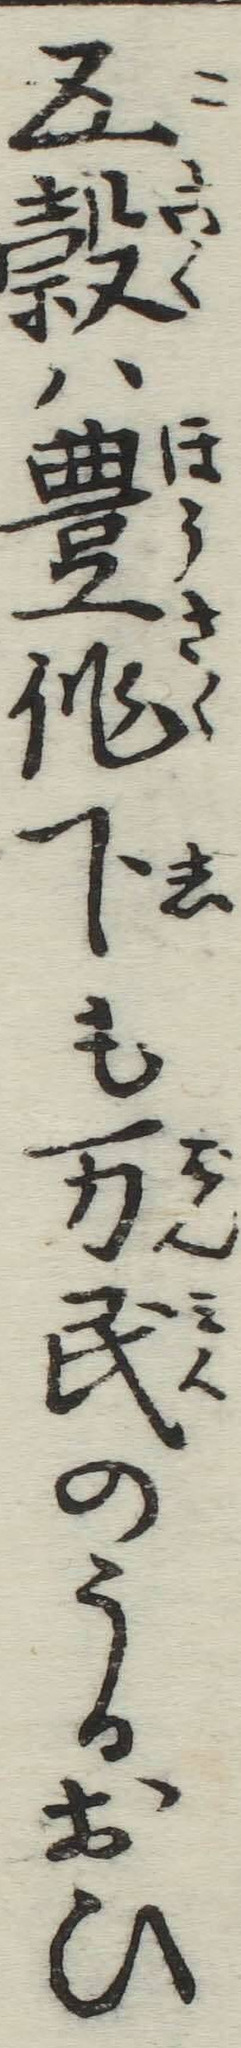五穀は豊作下も万民のうるおひ
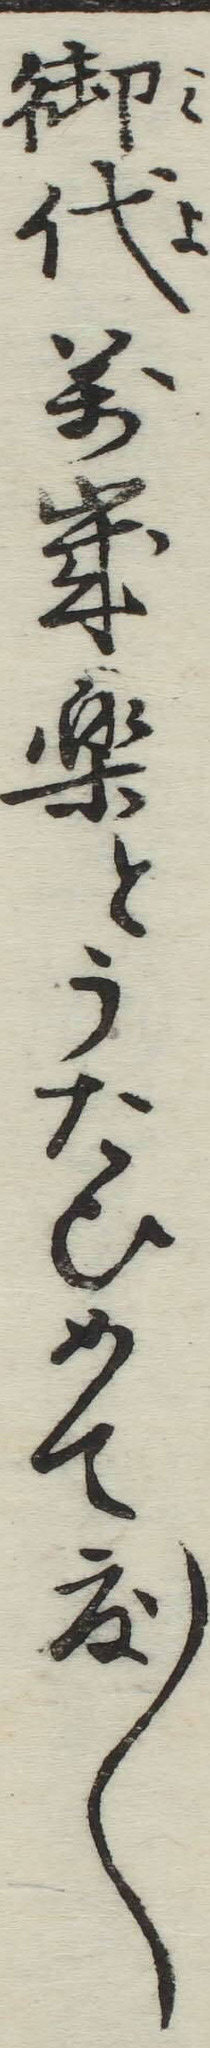御代万歳楽とうたひめて度〳〵
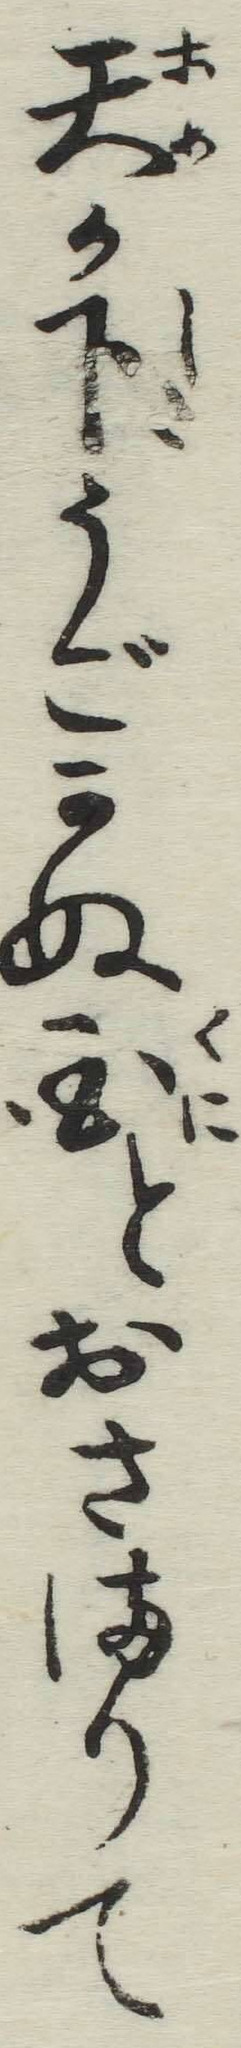天か下うごかぬ国とおさまりて
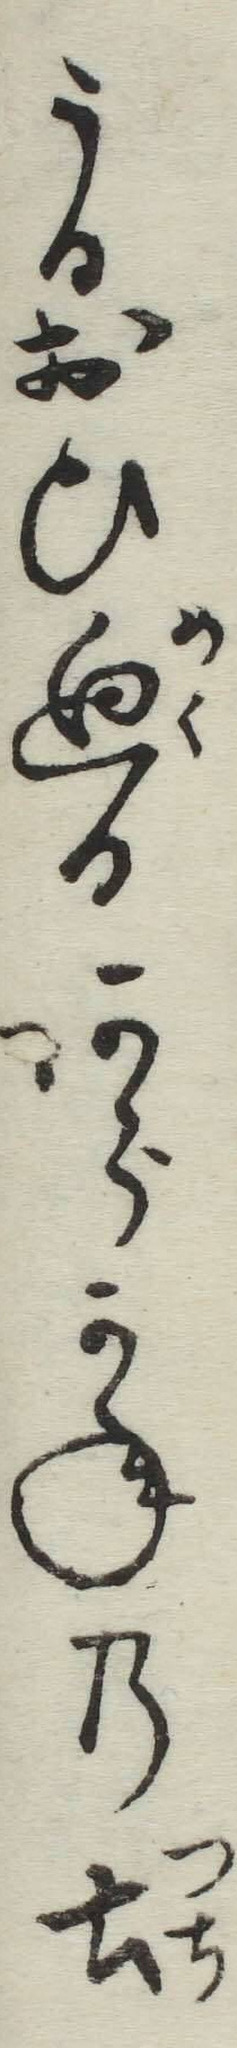うるおひ廻るからかねの土
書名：地震奇談／平安万歳楽
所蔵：国文学研究資料館
